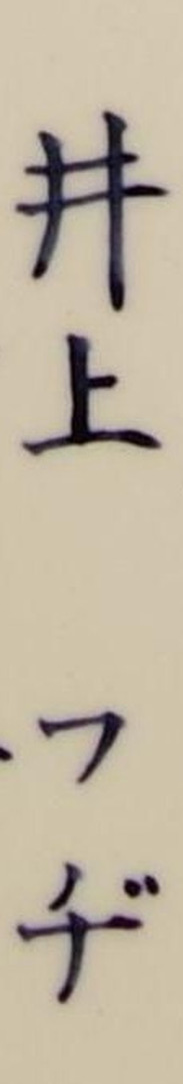井上フヂ
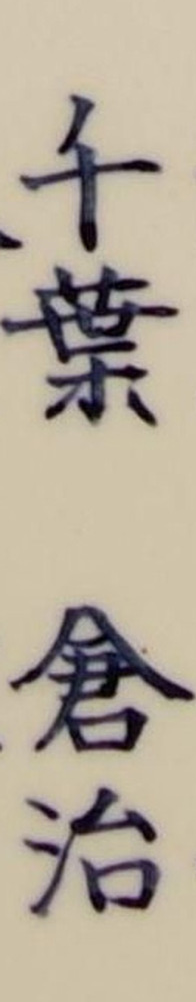千葉倉治
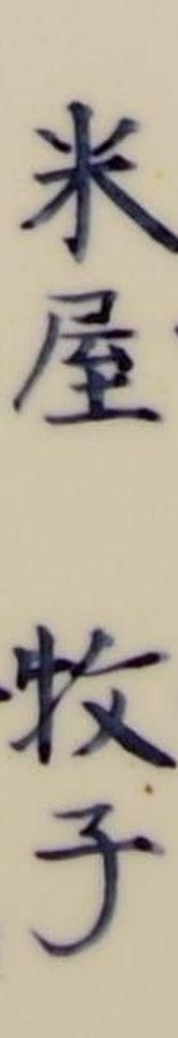米屋牧子
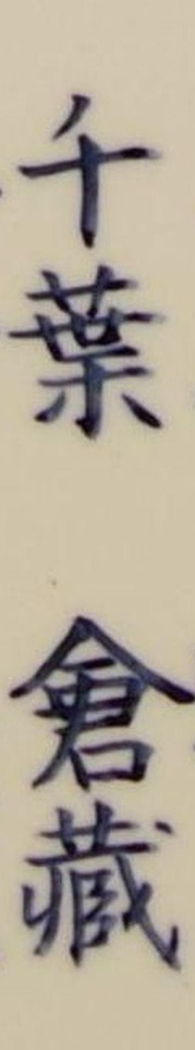千葉倉蔵
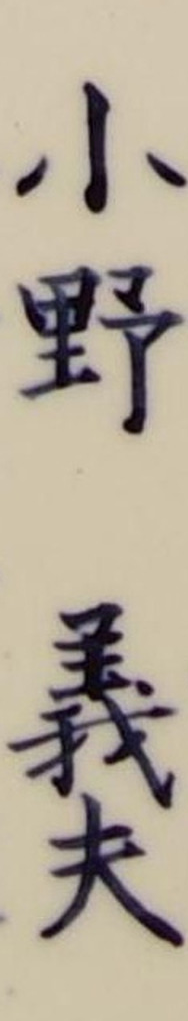小野義夫
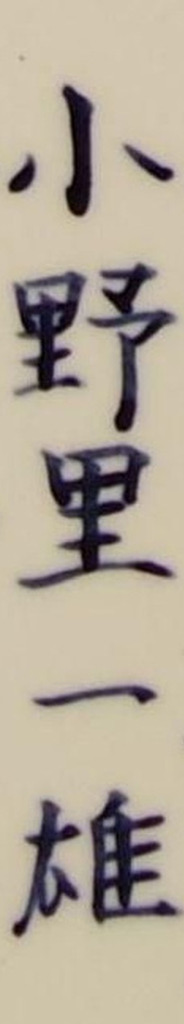小野里一雄
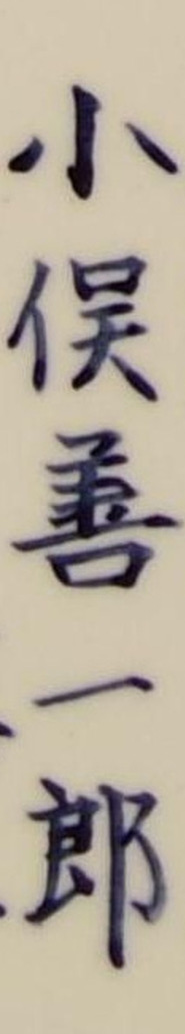小俣善一郎
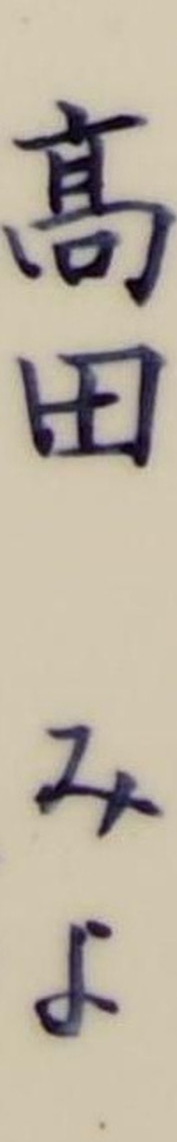高田みよ
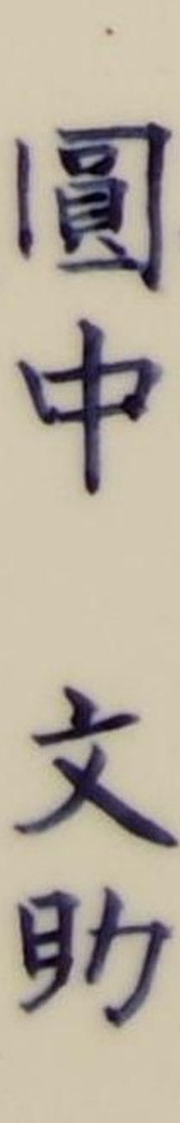圓中文助
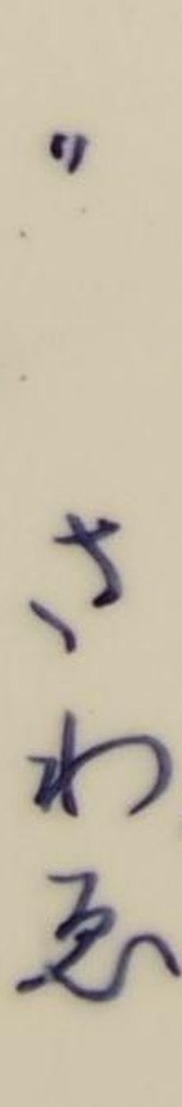さわゑ
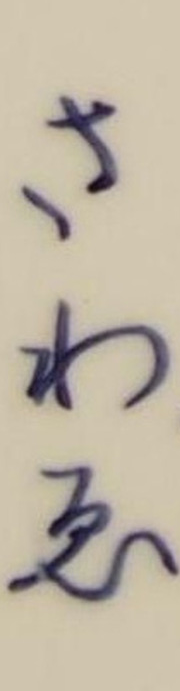さわゑ
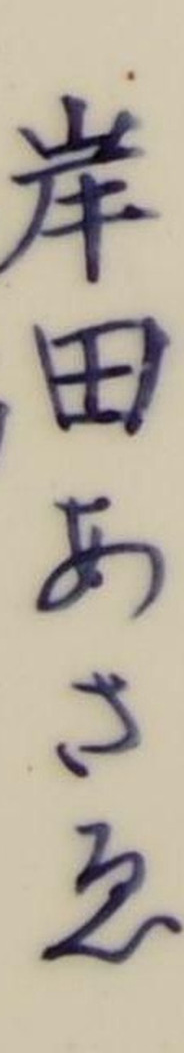岸田あさゑ
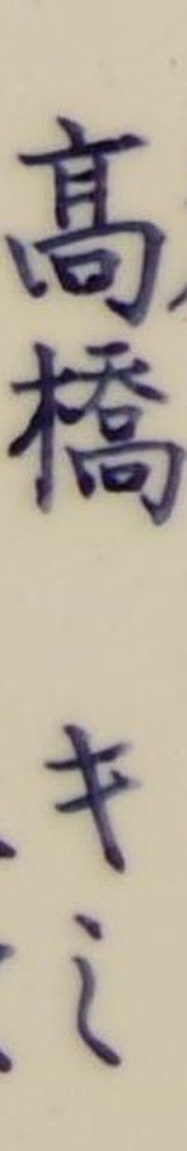高橋キミ
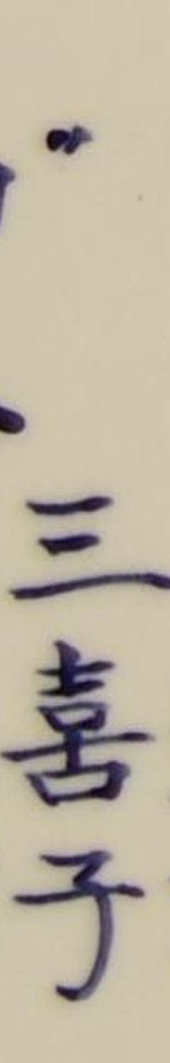三喜子
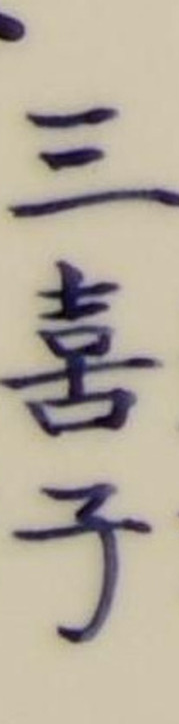三喜子
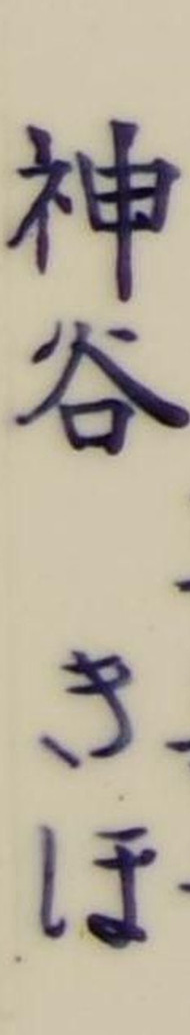神谷きほ
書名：A~D
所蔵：koyasan kongobuji
